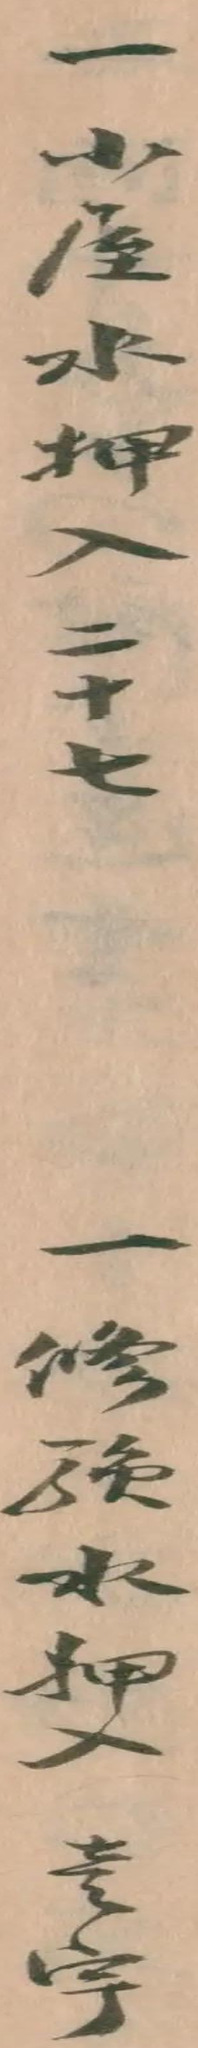一小屋水押入二十七一修験水押入壱宇
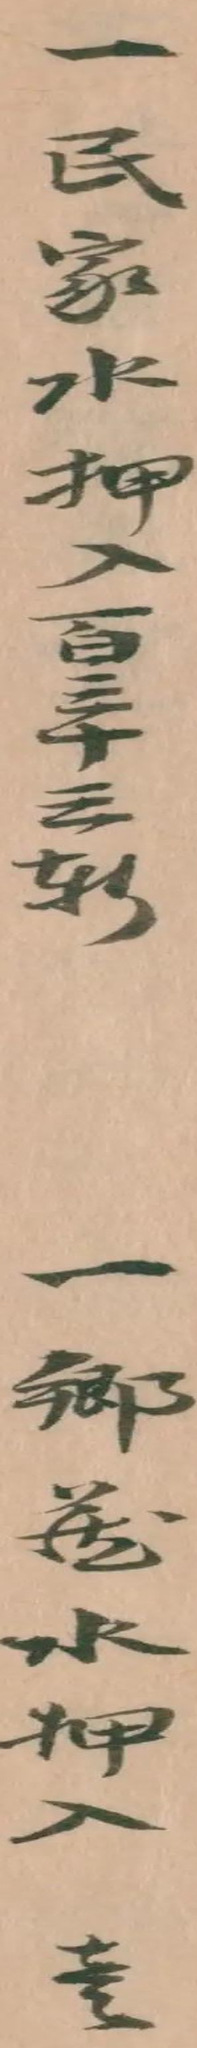一民家水押入百三十三軒一郷蔵水押入壱
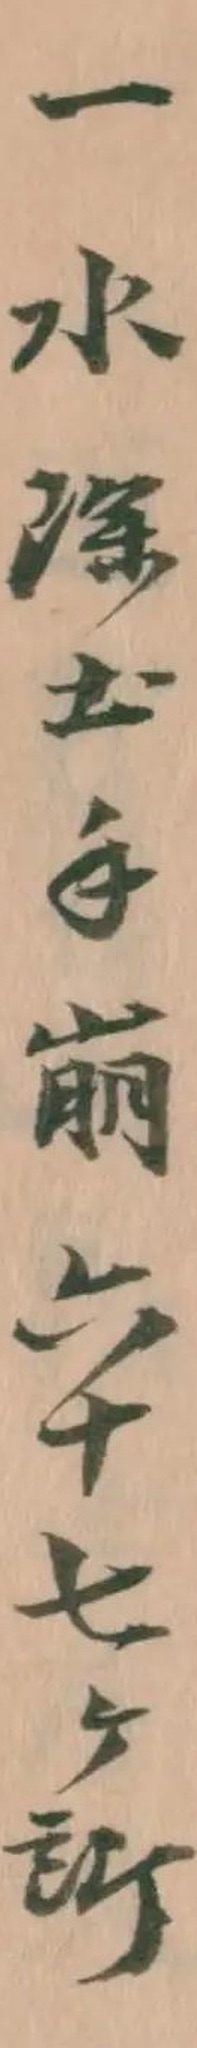一水除土手崩六十七ヶ所
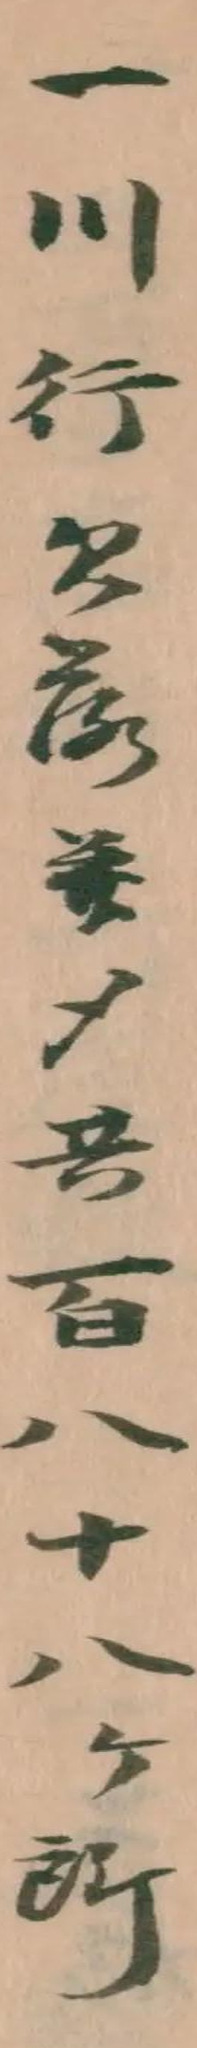一川行欠崩并〆共百八十八ヶ所
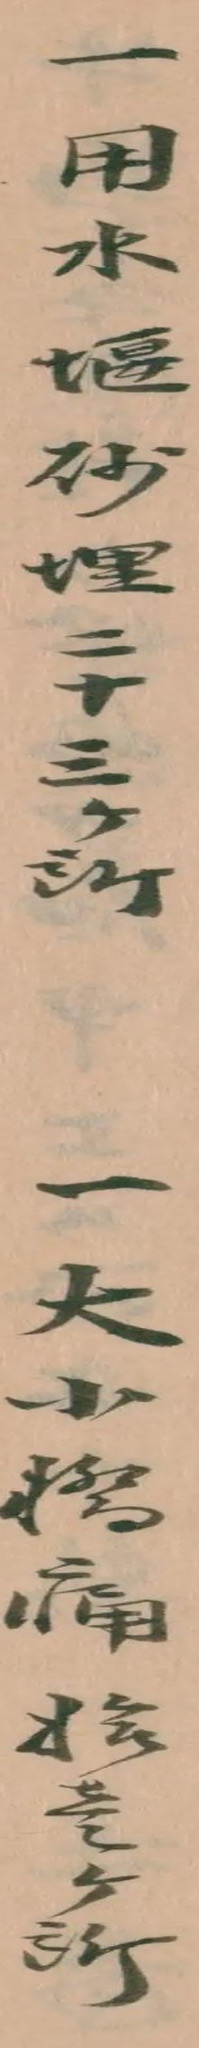一用水堰砂埋二十三ヶ所一大小橋痛拾壱ヶ所
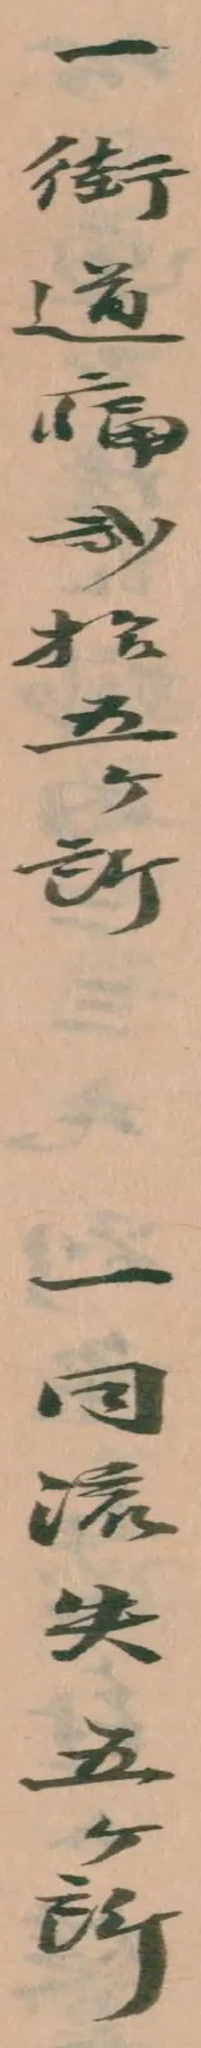一街道痛弐拾五ヶ所一同流失五ヶ所
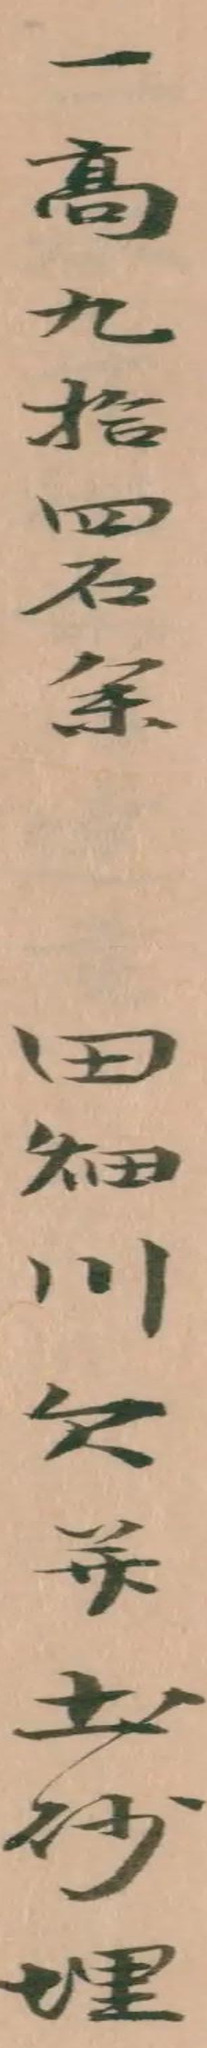一高九拾四石余田畑川欠并土砂埋
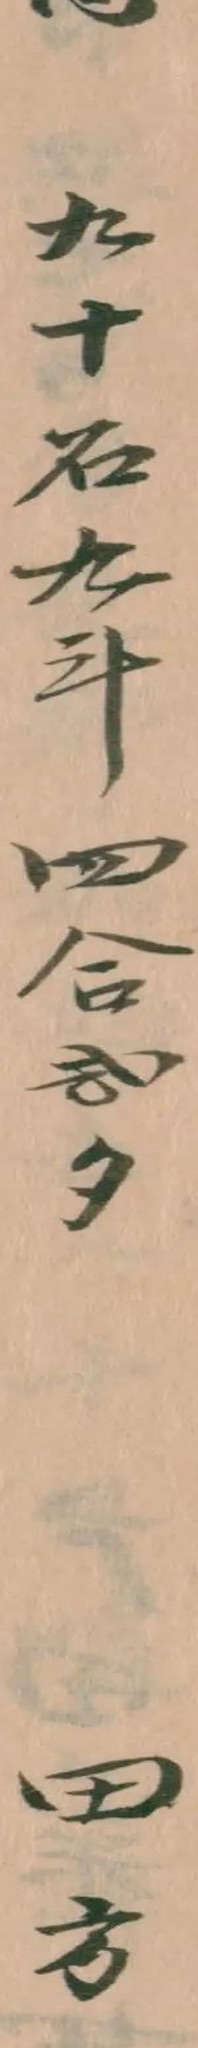内九十石九斗四合弐夕田方
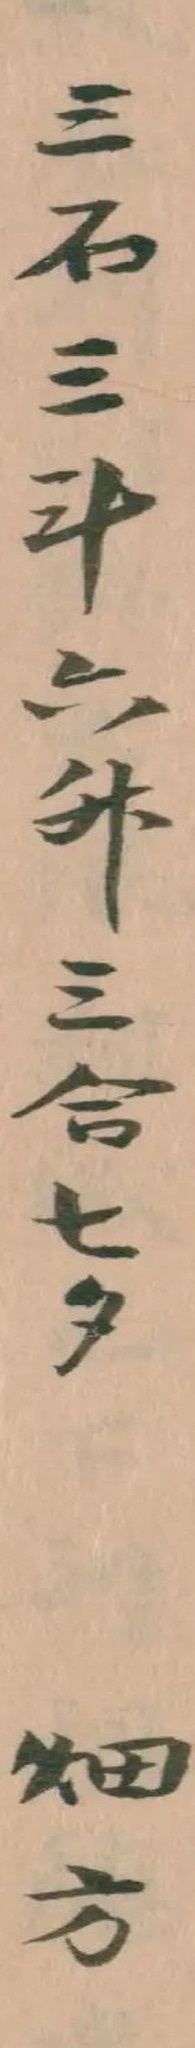三石三斗六升三合七夕畑方
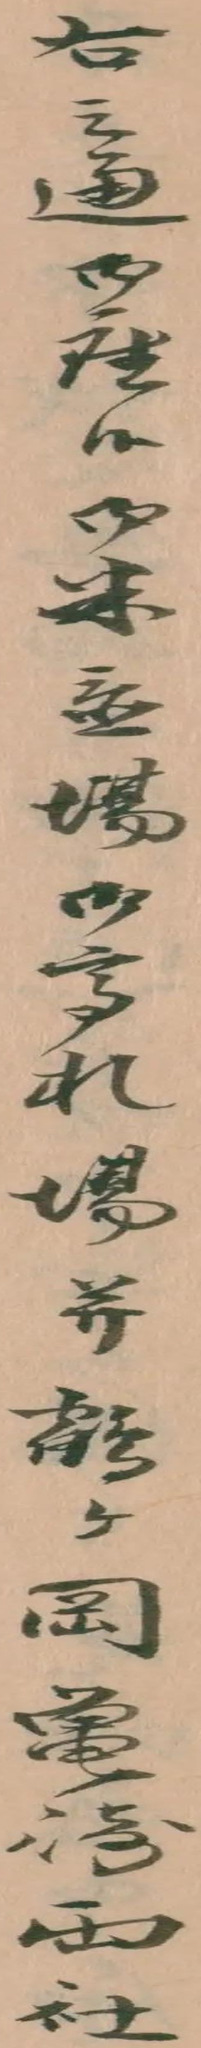右之通御座候御米置場御高札場并鶴ケ丘亀崎両社
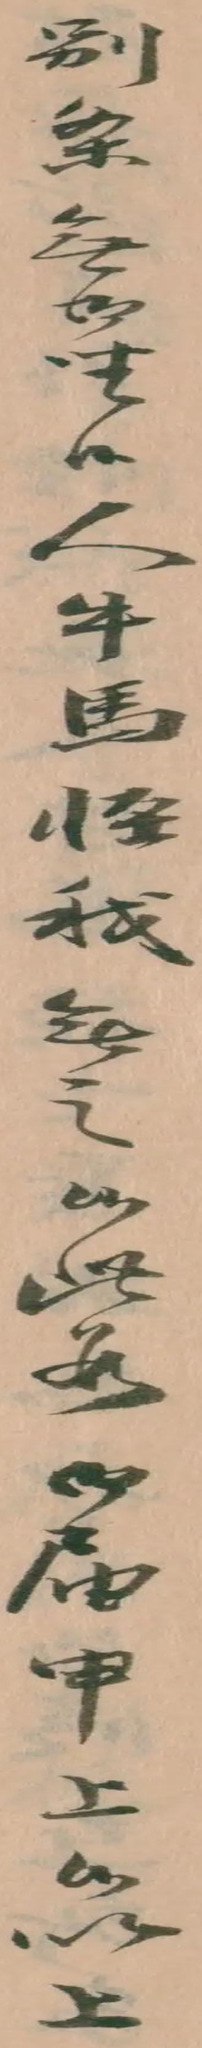別条無御座候人牛馬怪我無之候此段御届申上候以上
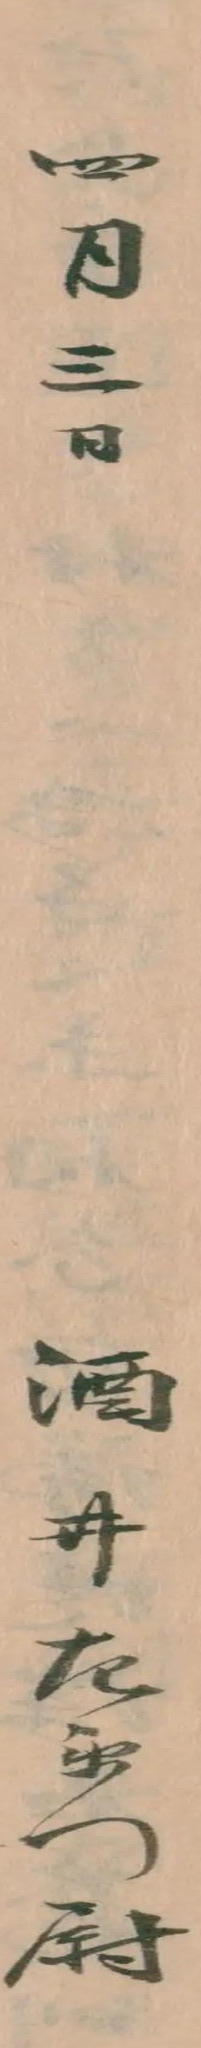四月三日酒井左衛門尉
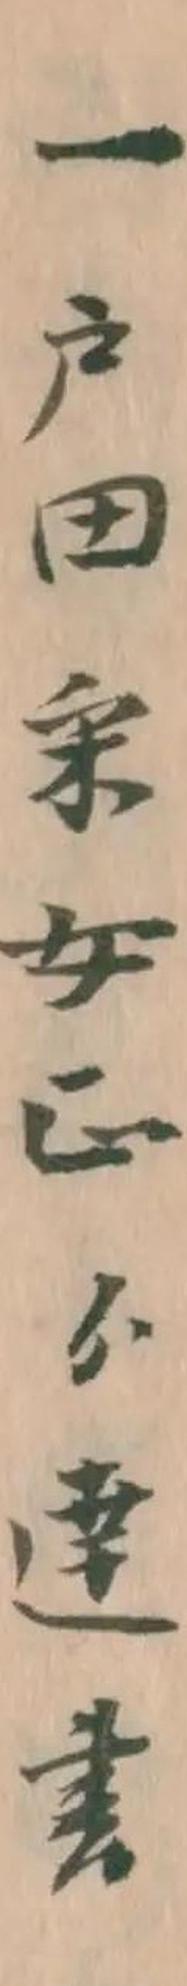一戸田采女正ゟ達書
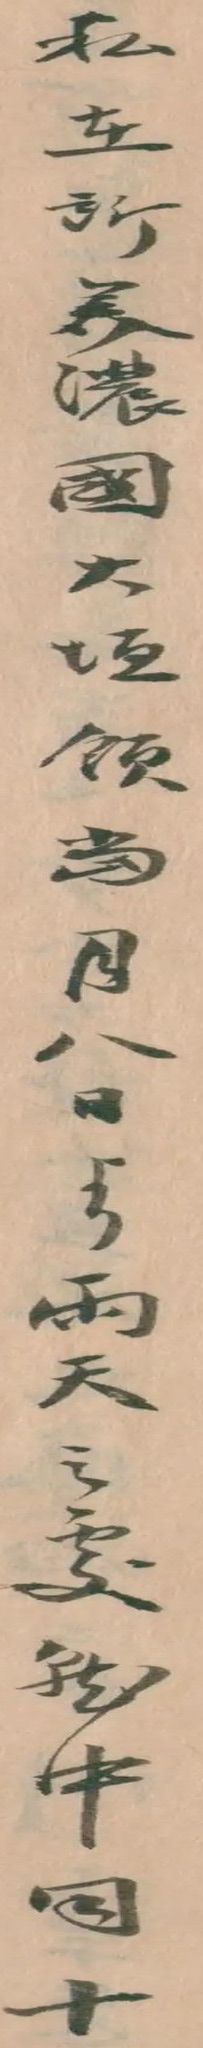私在所美濃国大垣領当月八日ゟ雨天之処就中同十
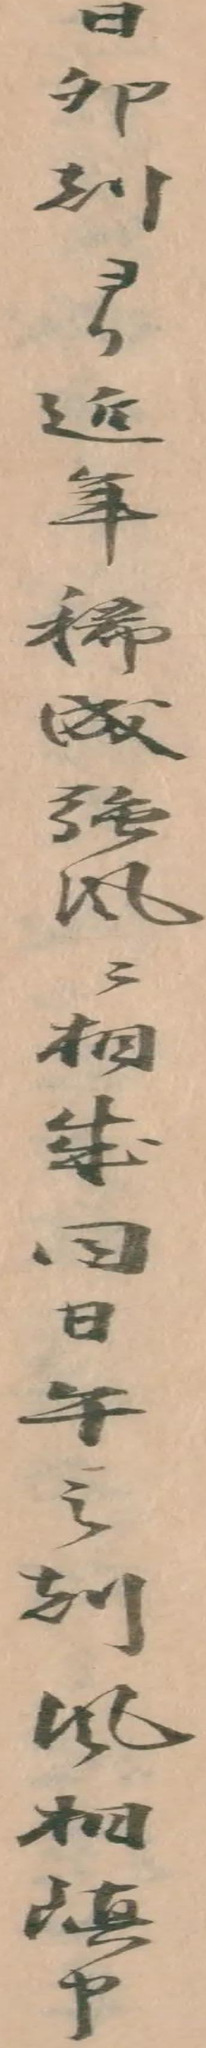日卯刻ゟ近年稀成強二相成同日午之刻風相鎮申

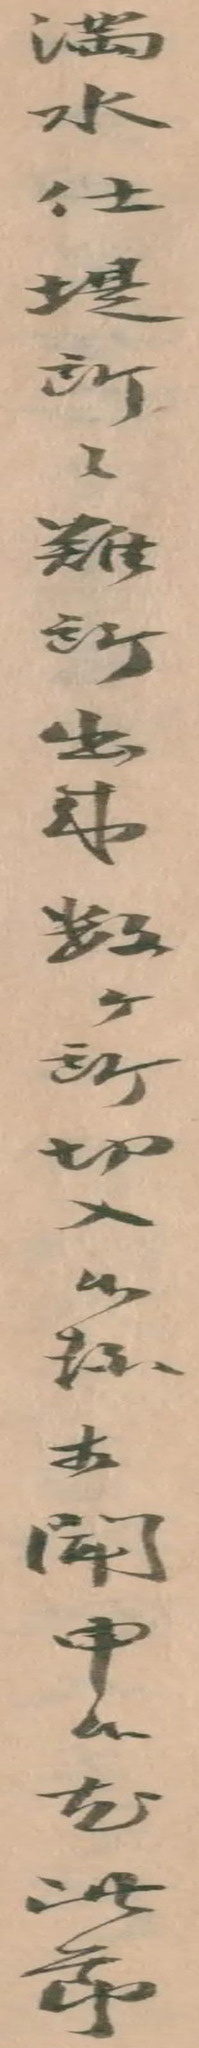満水仕堤所々難所出来数ヶ所切入候趣相聞申候尤此節
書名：地災撮要. 巻3(地震之部)-巻4(噴火之部)
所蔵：国立国会図書館 National Diet Library, JAPAN
